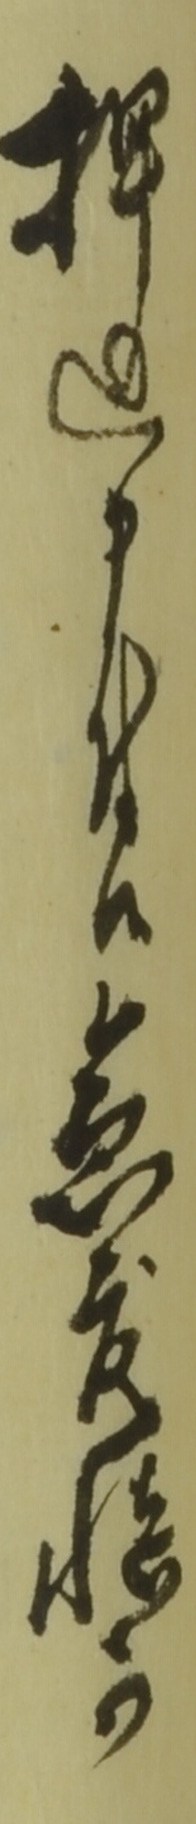押込申付候急度慎可
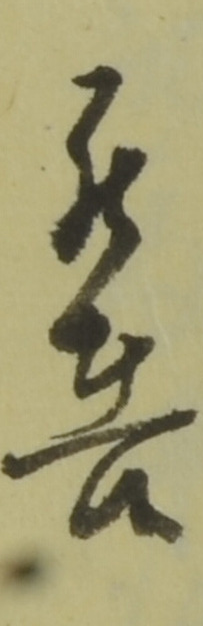罷在候
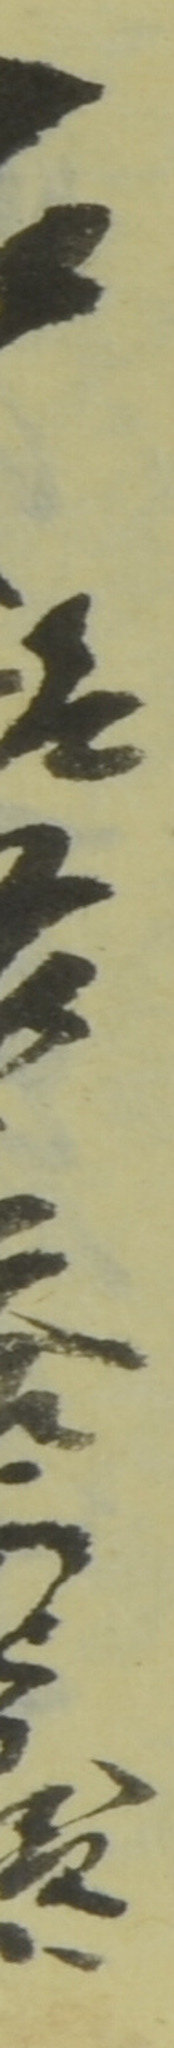右之趣各立合可被申渡候

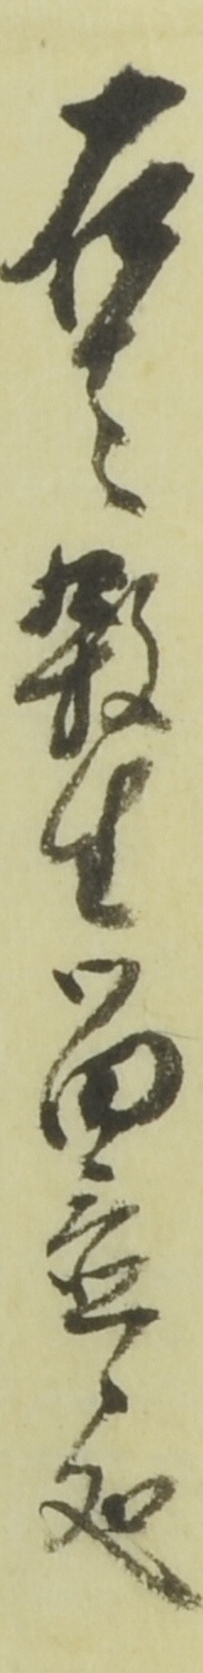右は殺生留置候処
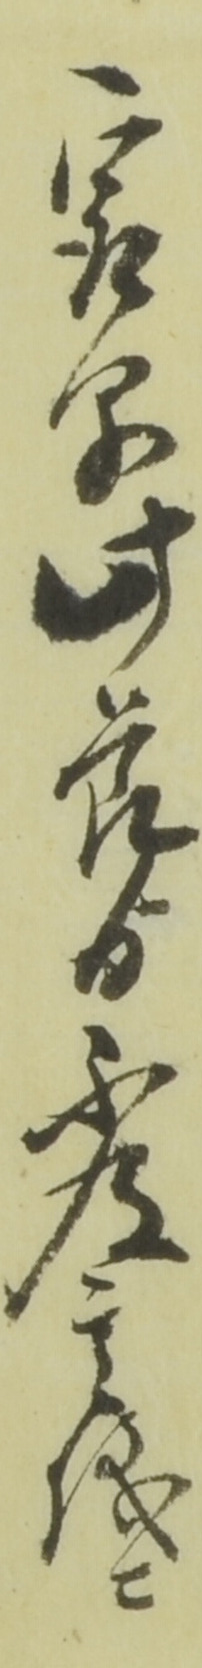最早此節ゟ不及其儀ニ
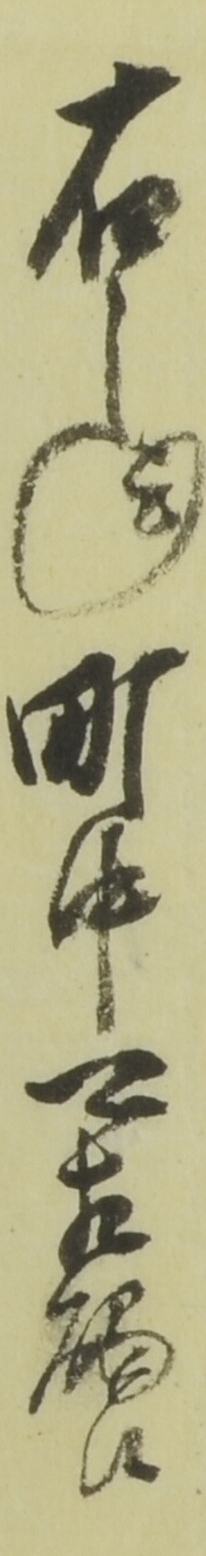右之趣町中可相触候
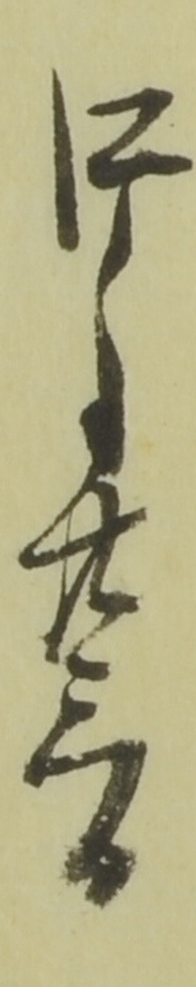四月廿三日
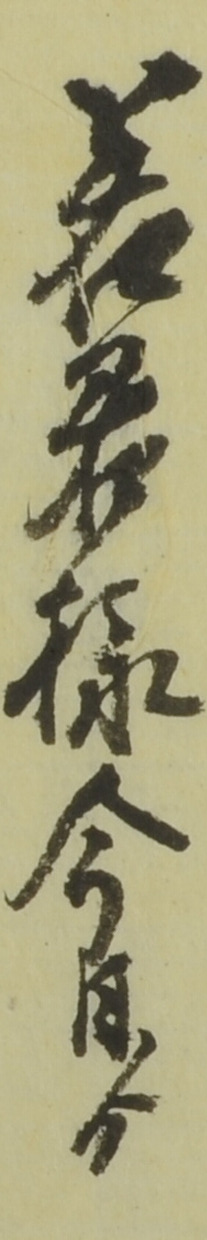若君様今日ゟ
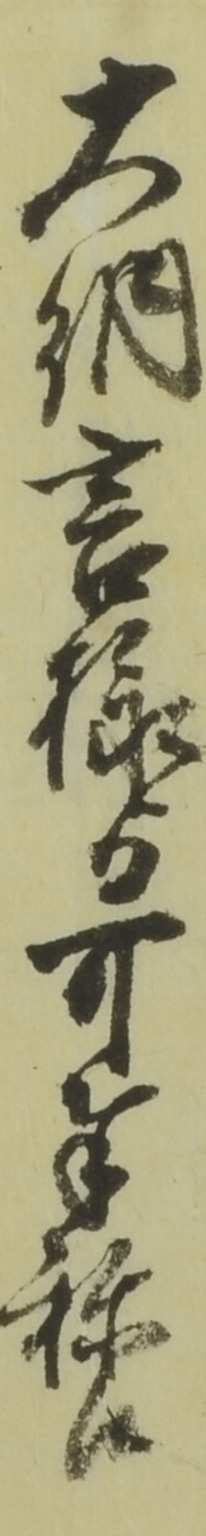大納言様ゟ可奉称候
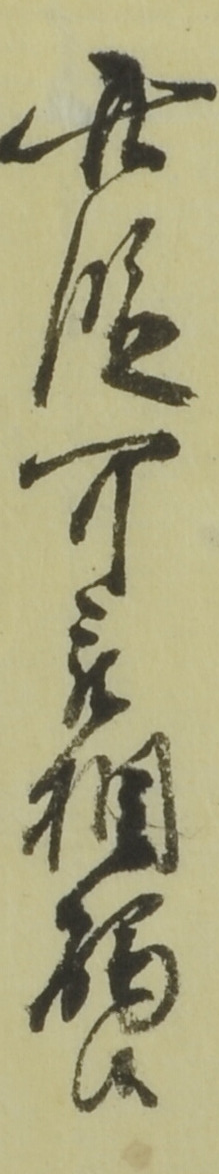此段可被相触候
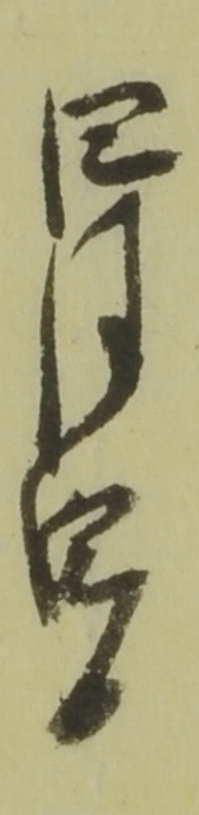四月四日
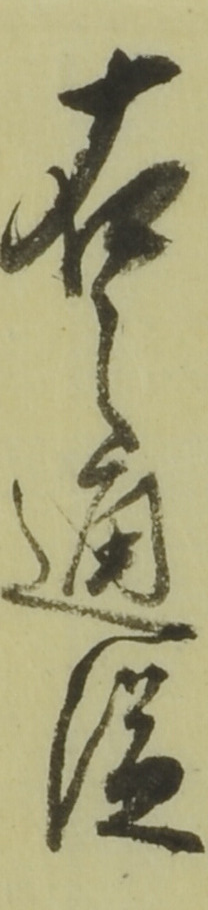右之通従
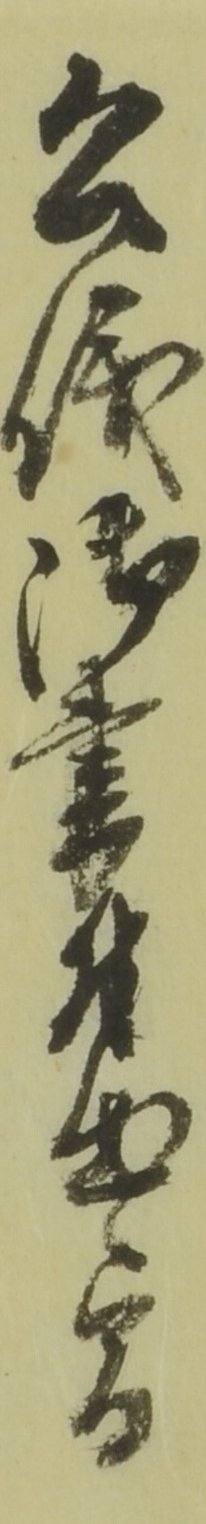公儀御書付出候間
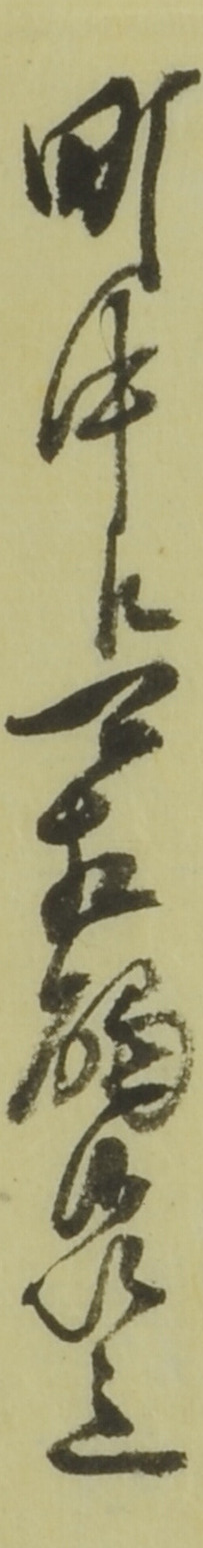町中江可相触候以上
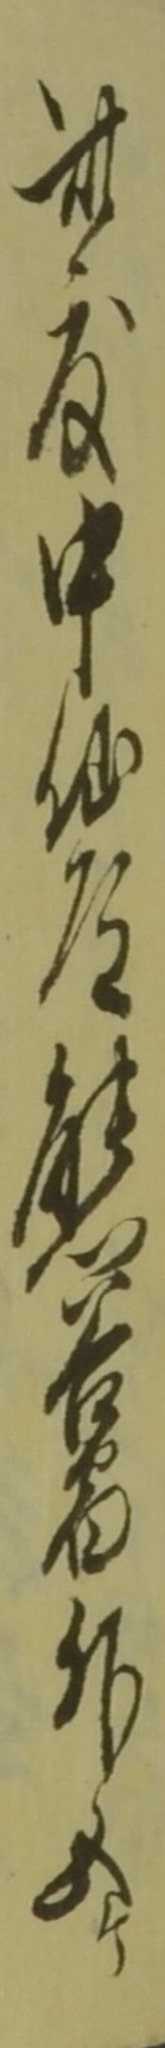此度中仙道熊谷宿外五ヶ
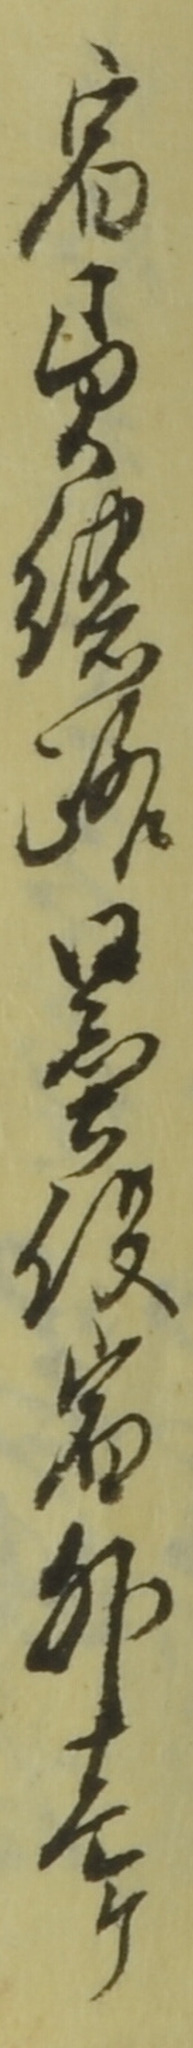宿美濃路ニ墨役宿外壱ヶ
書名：御触書御書附控
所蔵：伊那市立高遠町図書館・合同会社AMANE
